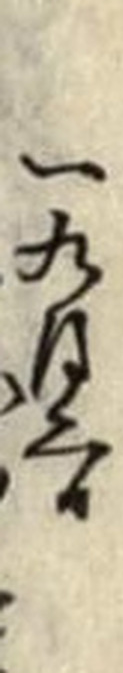一九月二日
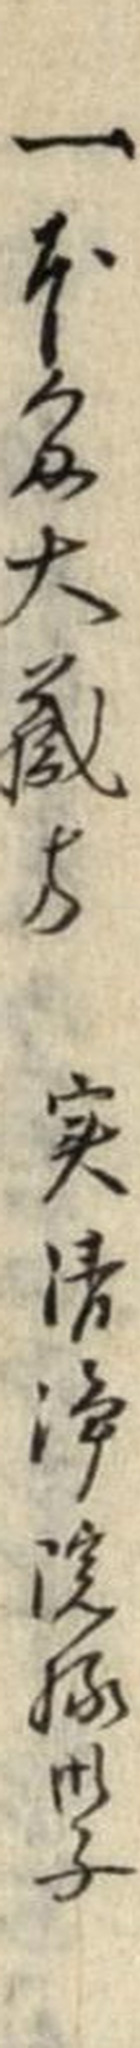一本多大蔵方実清浄院様御子
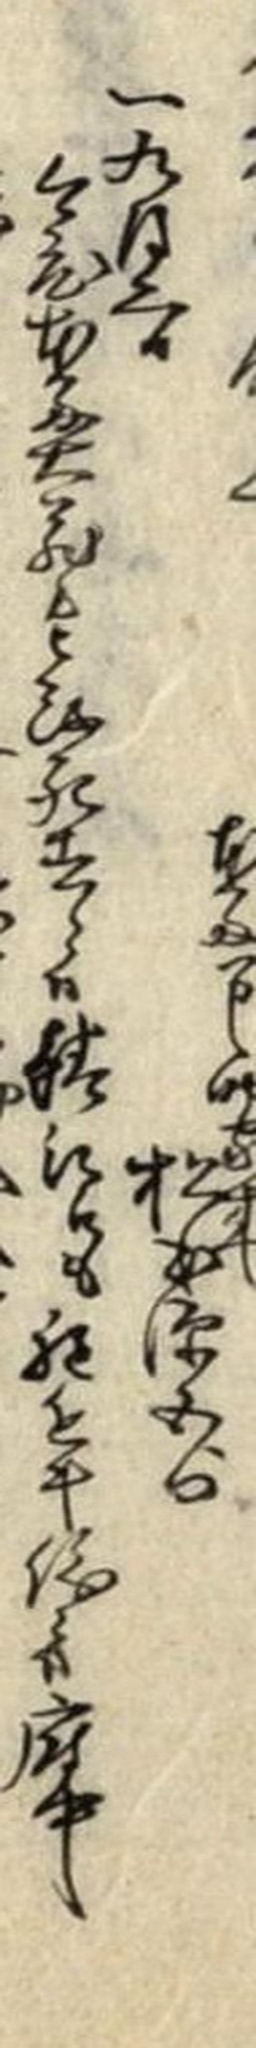今度本多大蔵方被致死去候に付鯖江えも程近キ儀に付府中
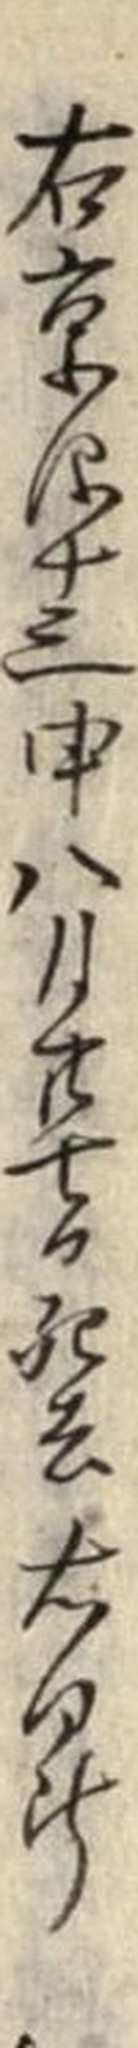右享保十三申八月廿七日死去右同断
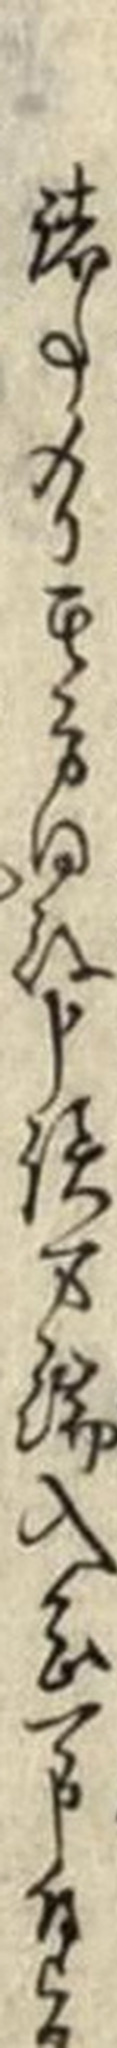諸事〆り其方同役申談万端入念可申付旨
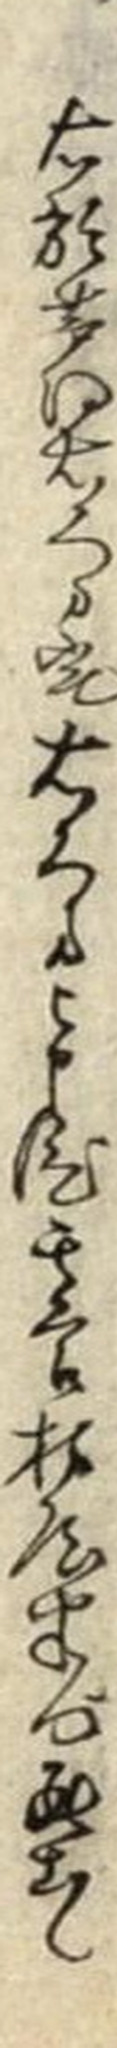右於芦田右衛門方宅右衛門方被申渡其節栃屋半右衛門罷出候
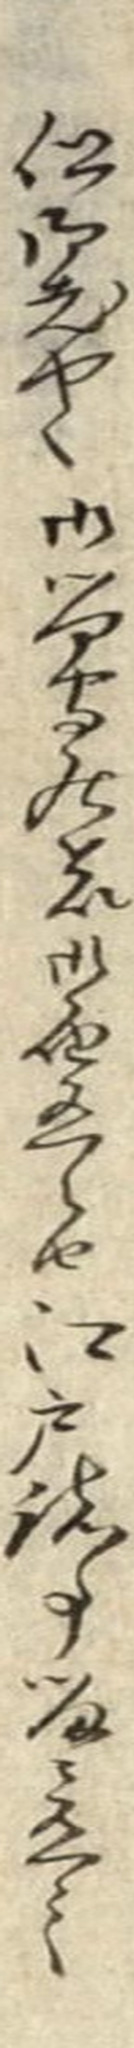但御老中へ御留守居を以御届有之由江戸諸事留に有之
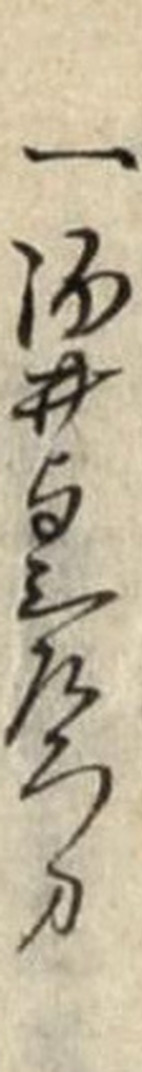一酒井与三左衛門方
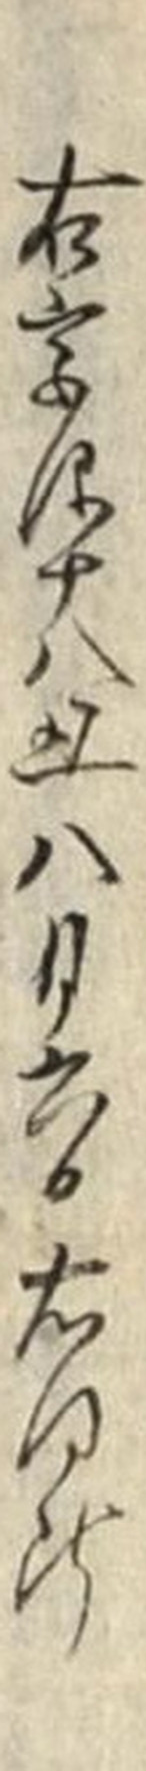右享保十八丑八月六日右同断
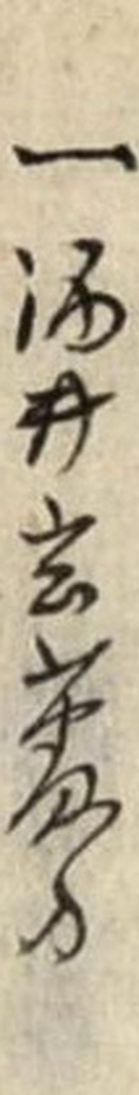一酒井玄蕃方
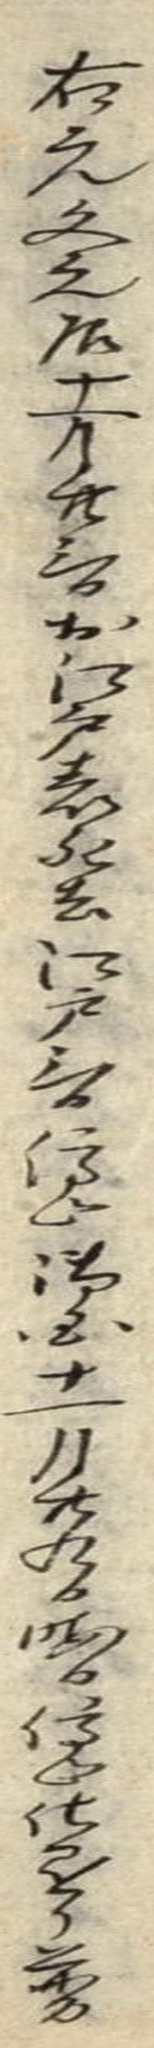右元文元辰十一月廿三日於江戸表死去江戸三日停止御国十一月廿九日晦日停止仕懸り普
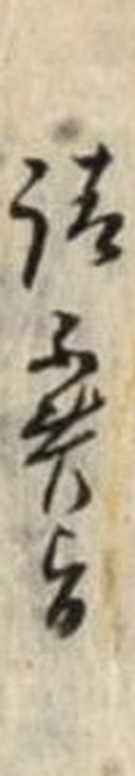請不苦旨
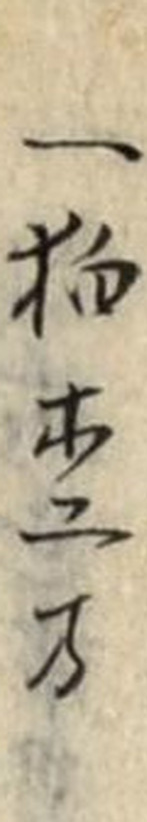一狛木工方
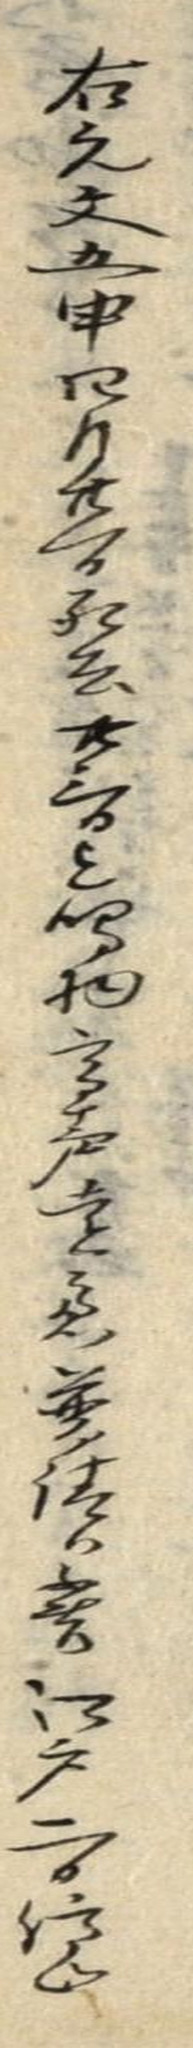右元文五申四月廿一日死去廿三日迄鳴物高声遠慮普請は不苦江戸二日停止

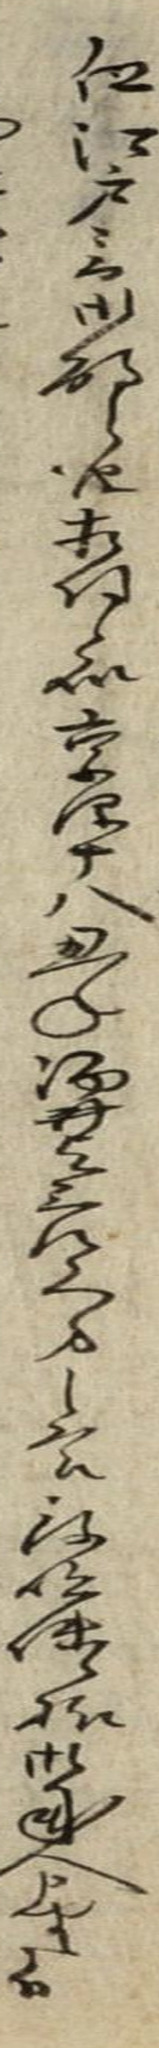但江戸にて御触之儀相伺候処享保十八丑年酒井与三左衛門方之節致吟味候様御用人申聞候に付
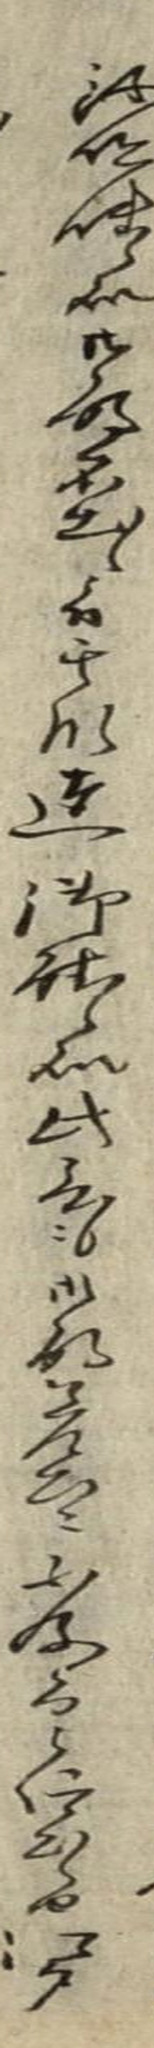致吟味候処御触不出候に付其段達御聴候処此度も御触差出に不及旨被仰出候由江戸
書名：御停止異変死失
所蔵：福井県文書館 Fukui Prefectural Archives
